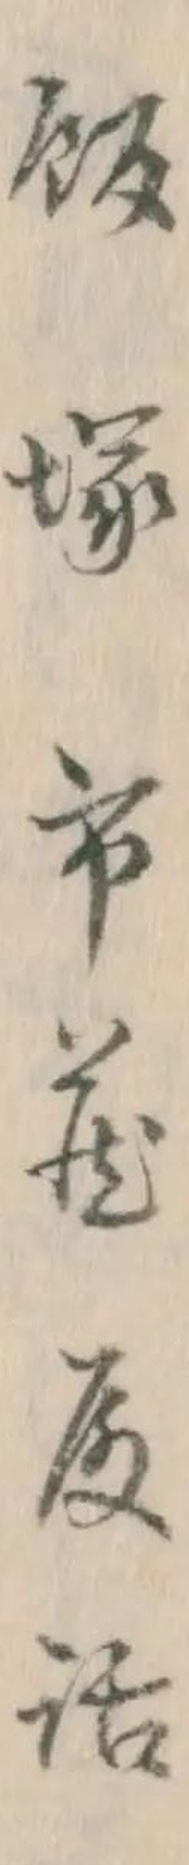飯塚市蔵殿話
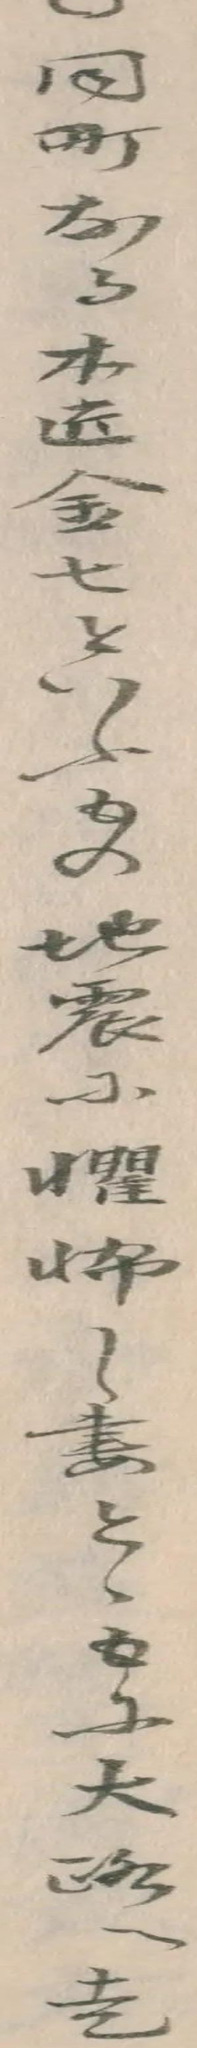〇同町なる木匠金七といふもの地震に懼怖し妻とゝもに大路へ走
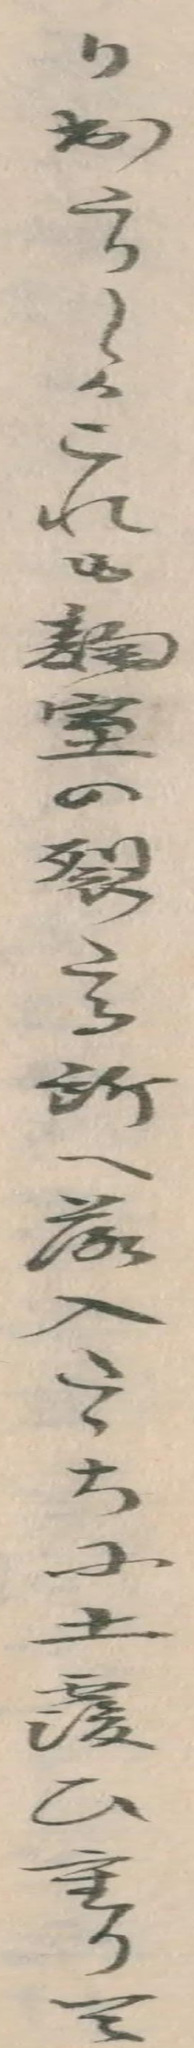り出たりしかこれも麹室の裂たる所へ落入たゝちに土覆ひ重りて
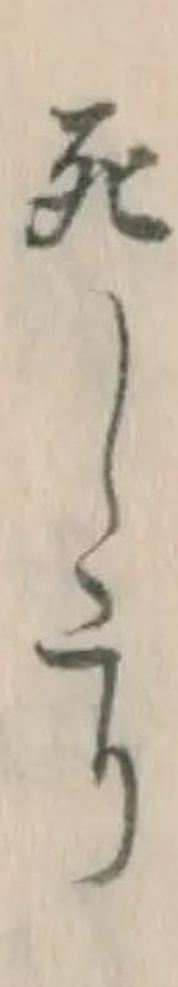死したり
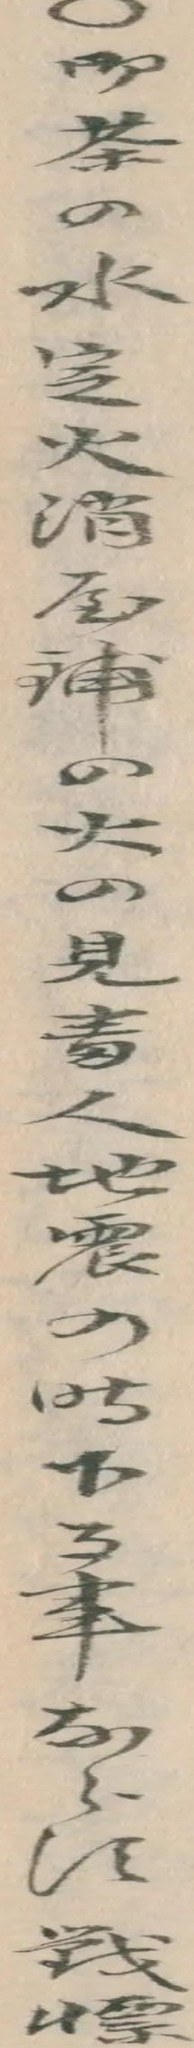〇御茶の水定火消屋鋪の火の見番人地震の時下る事ならす戦慓

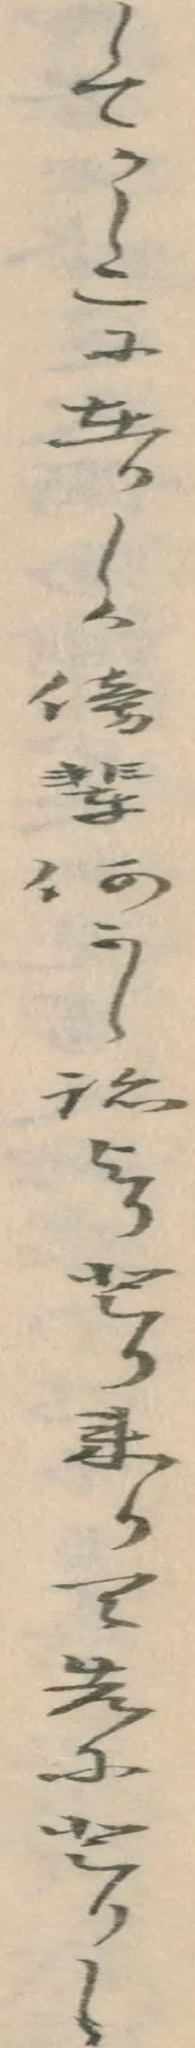してかしこに在りしか傍輩あかし跡よりとり来りて先にとりし
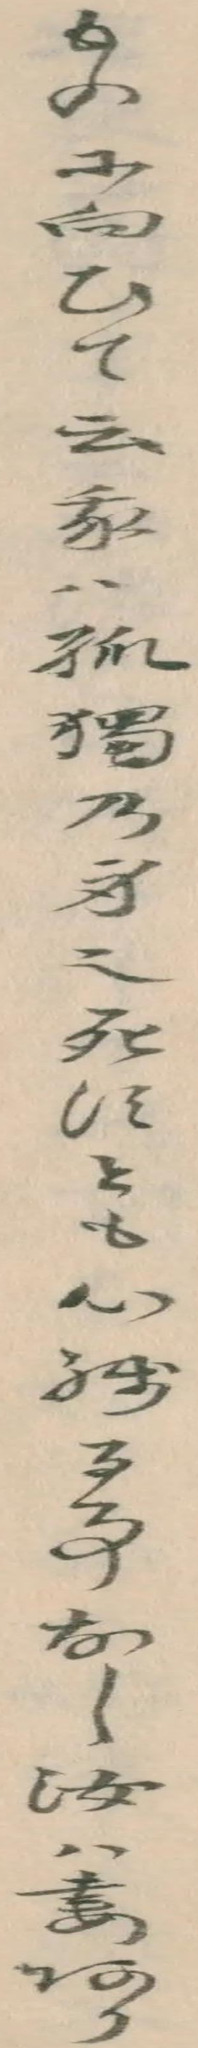ものに向ひて云我は孤独の身也死すとも心残る事なし汝は妻あり
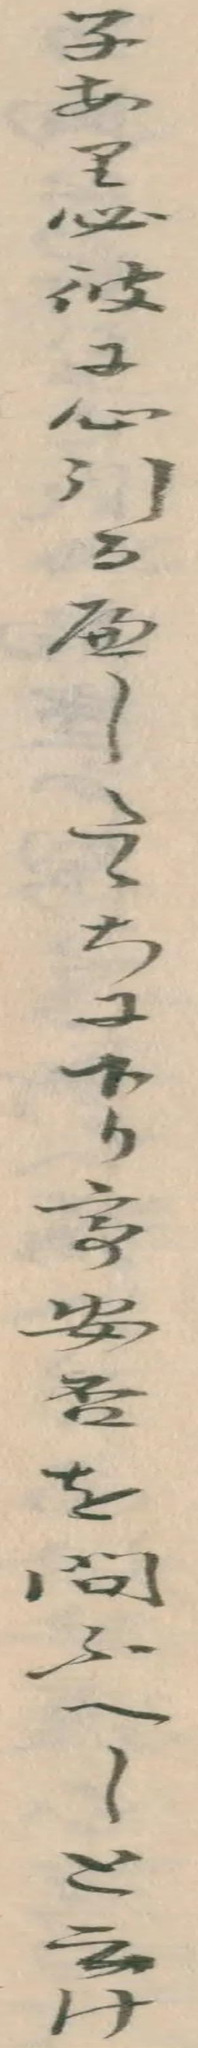子あり必彼に心引るへしたゝちに下りて安否を問ふへしと云け
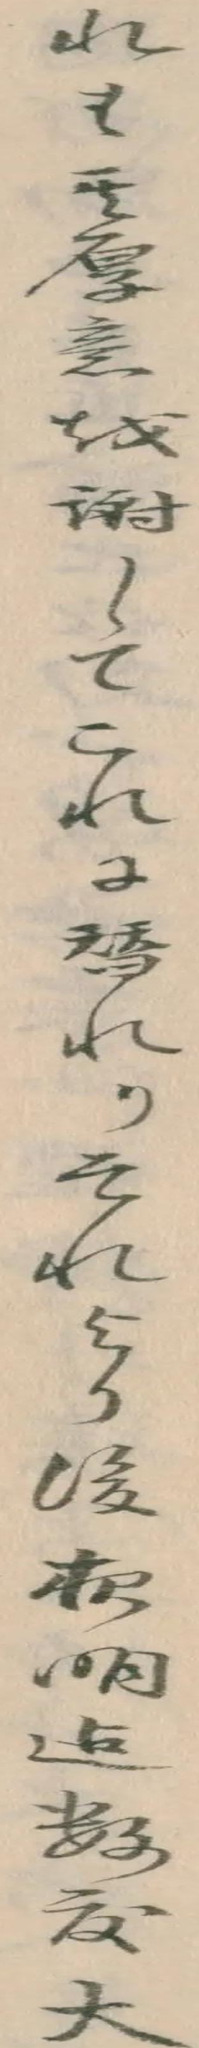れは其厚意を謝してこれに替れりそれより後夜明迄数度大
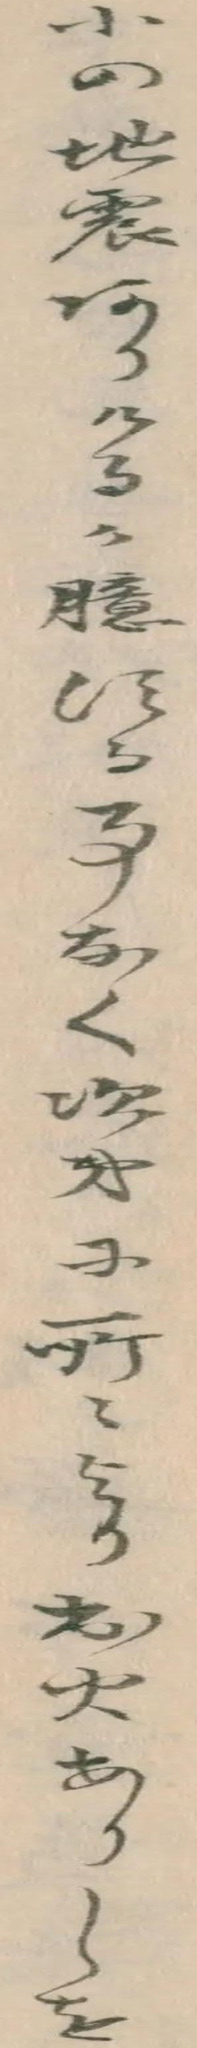小の地震ありけるか臆する事なく次第に所々より出火ありしを
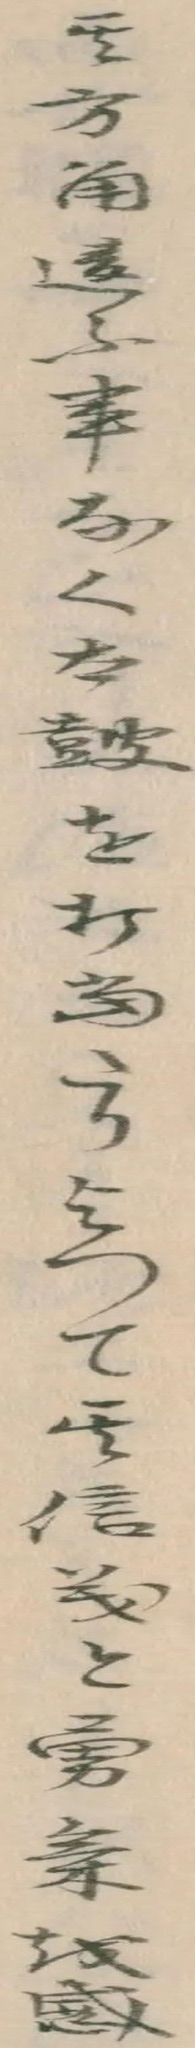其方角違ふ事なく太鼓を打当たりよつて其信義と勇気を感
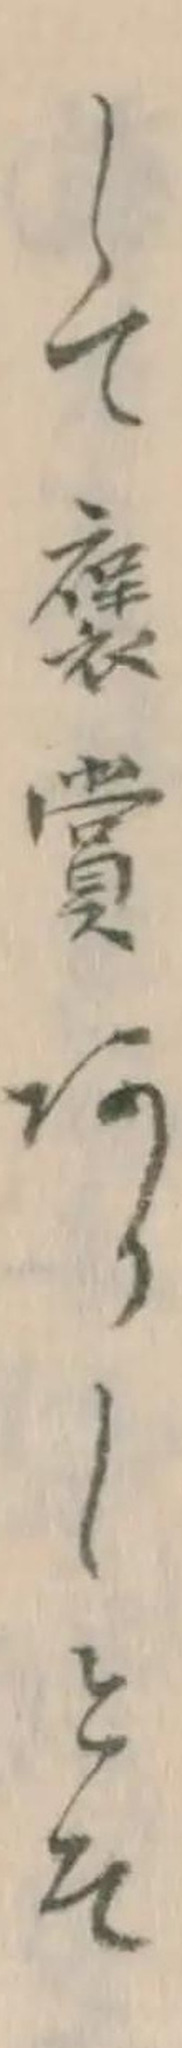して褒賞ありしとそ
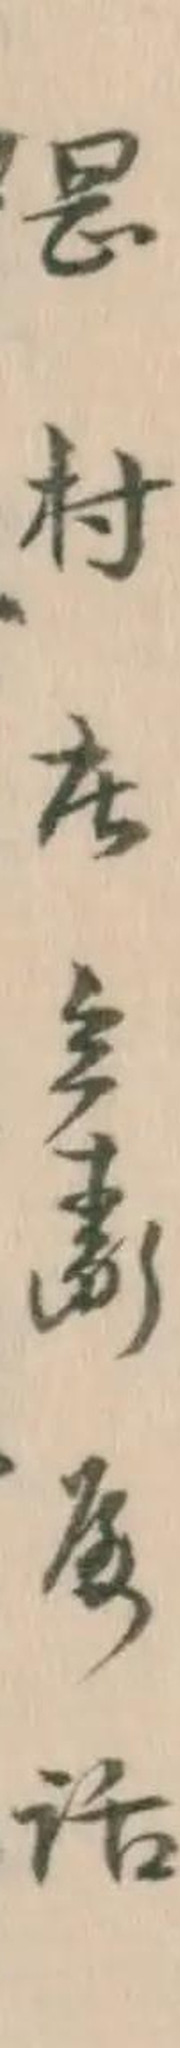岡村庄兵衛殿話
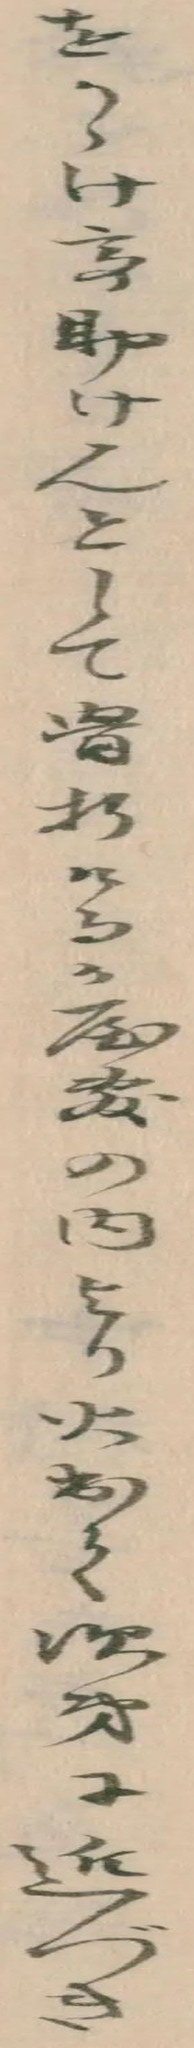をかゝけて助けんとして骨折けるか屋敷の内より火出て次第に近づき
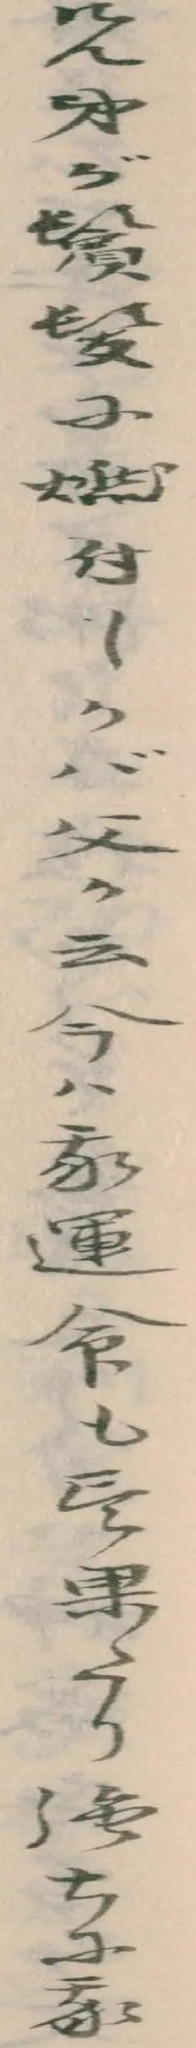けん弟が鬢髪に燃付しかば父か云今は我運命も尽果たり強ちに我
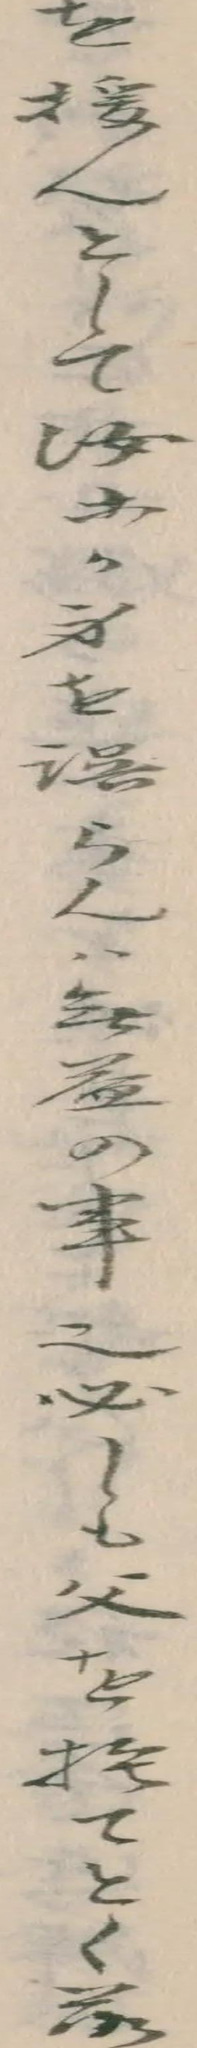を援んとして汝等か身を誤らんは無益の事也必しも父を捨てとく落
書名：地災撮要. 巻7-9(地震之部)
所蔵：国立国会図書館 National Diet Library, JAPAN
